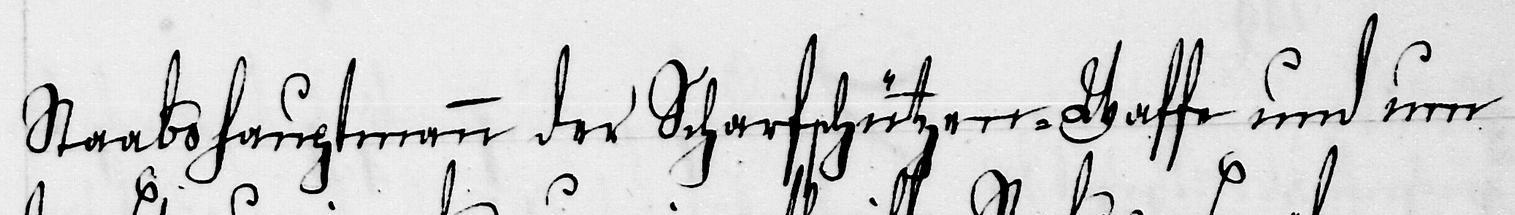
Staabshauptmann der Scharfschützen-Waffe und um
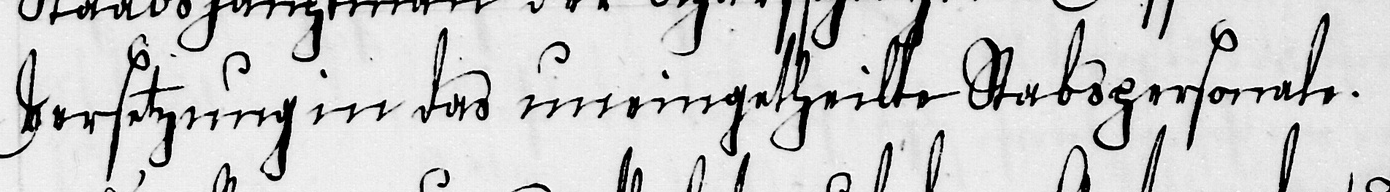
Versetzung in das uneingetheilte Stabspersonale.
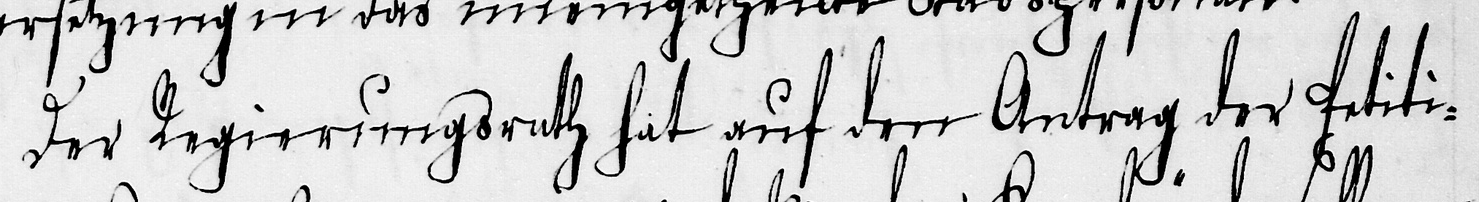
Der Regierungsrath hat auf den Antrag der Petiti¬
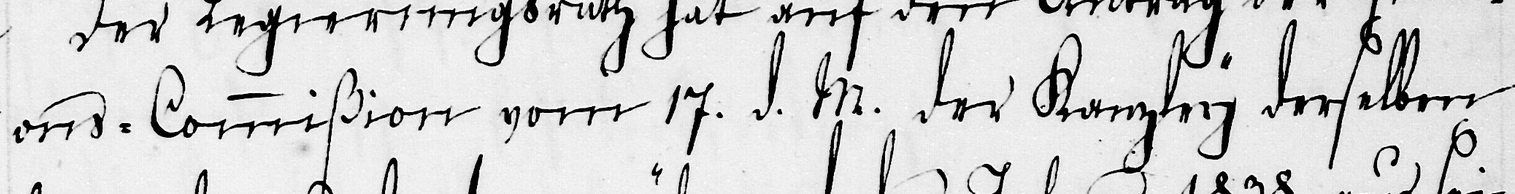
ons-Commißion vom 17. d. M. der Kanzley derselben
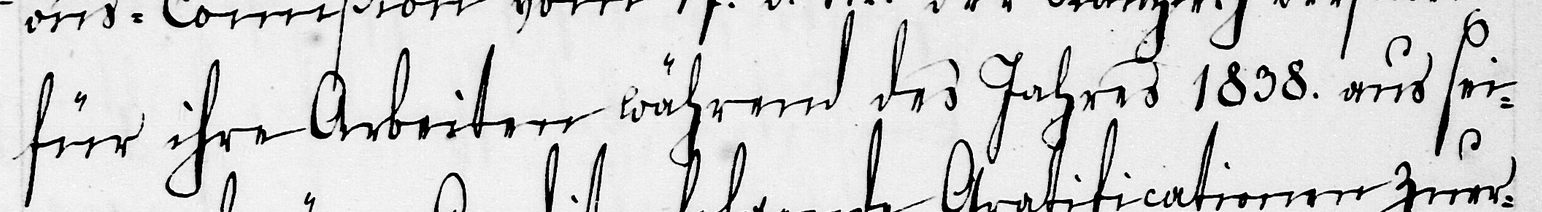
für ihre Arbeiten während des Jahres 1838. aus sei¬
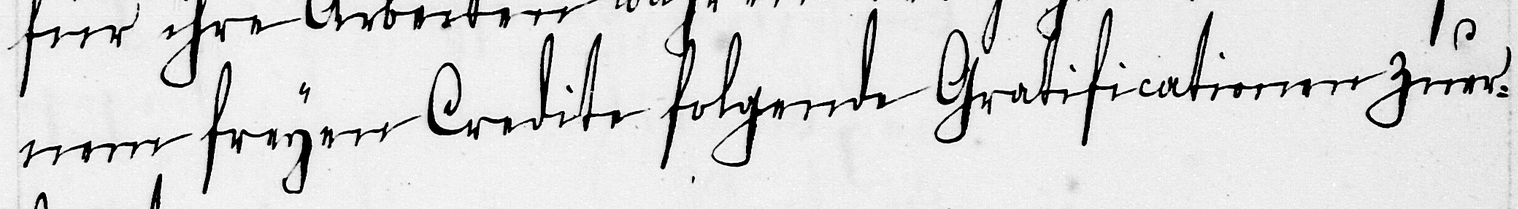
nem freyen Credite folgende Gratificationen zuer¬
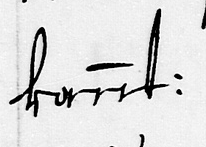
kannt:
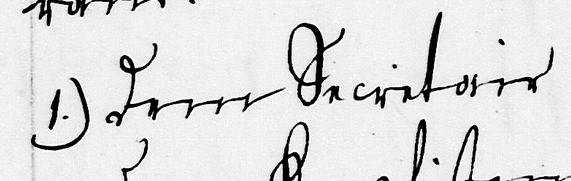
1.) Dem Secretair
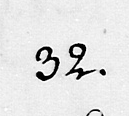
32.
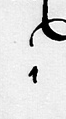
„
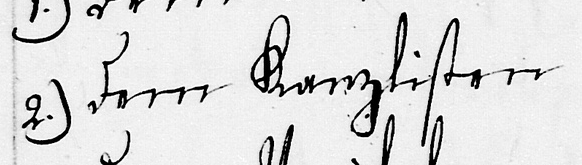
2.) Dem Kanzlisten
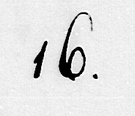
16.
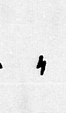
„
